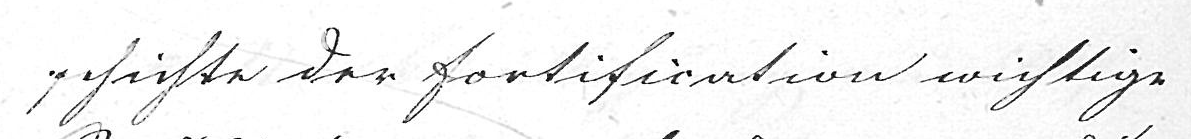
schichte der Fortification wichtige
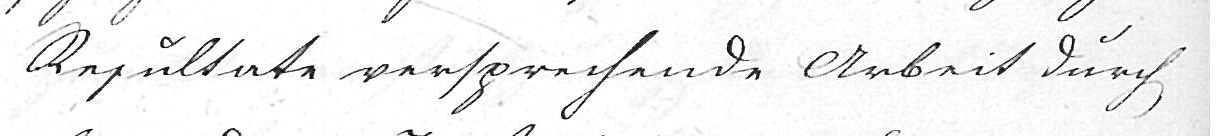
Resultate versprechende Arbeit durch
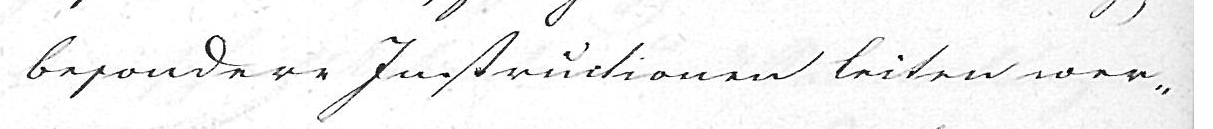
besondere Instructionen leiten wer-
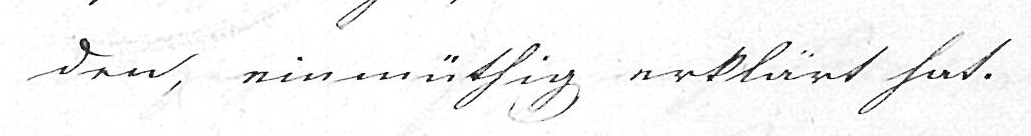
den, einmüthig erklärt hat.
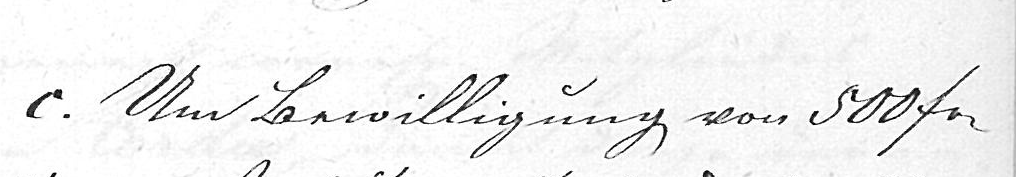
c. Um Bewilligung von 500 fr
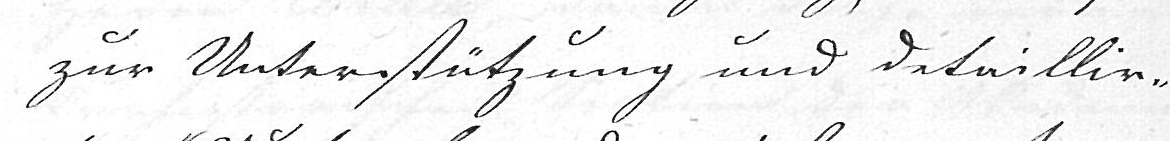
zur Unterstützung und detaillir-
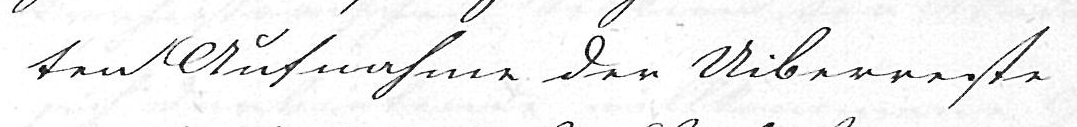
ten Aufnahme der Uiberreste
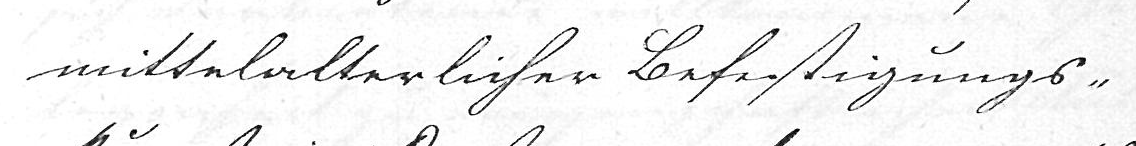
mittelalterlicher Befestigungs-
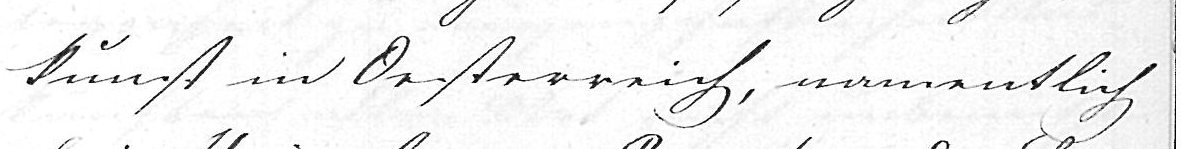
kunst in Oesterreich, namentlich
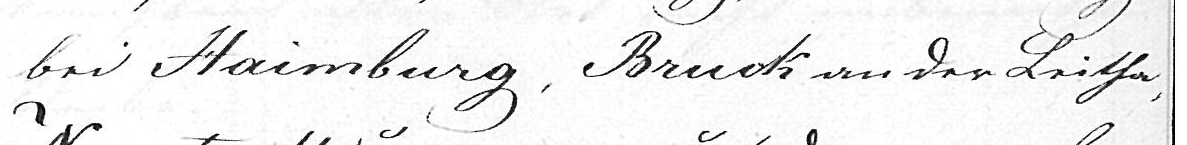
bei Haimburg, Bruck an der Leitha,
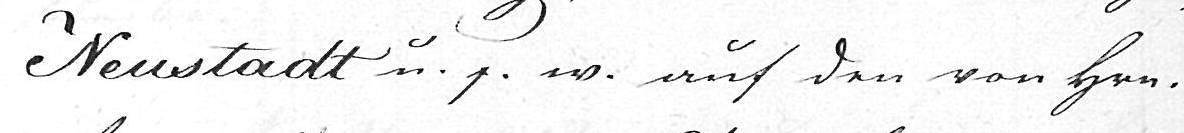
Neustadt u. s. w. auf den von Hrn.
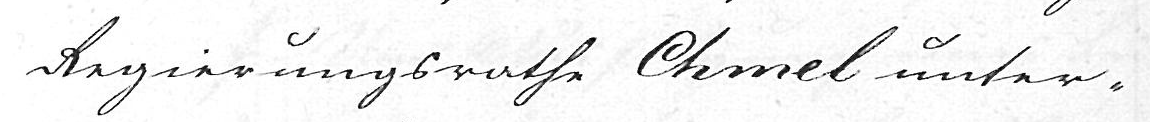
Regierungsrathe Chmel unter-
